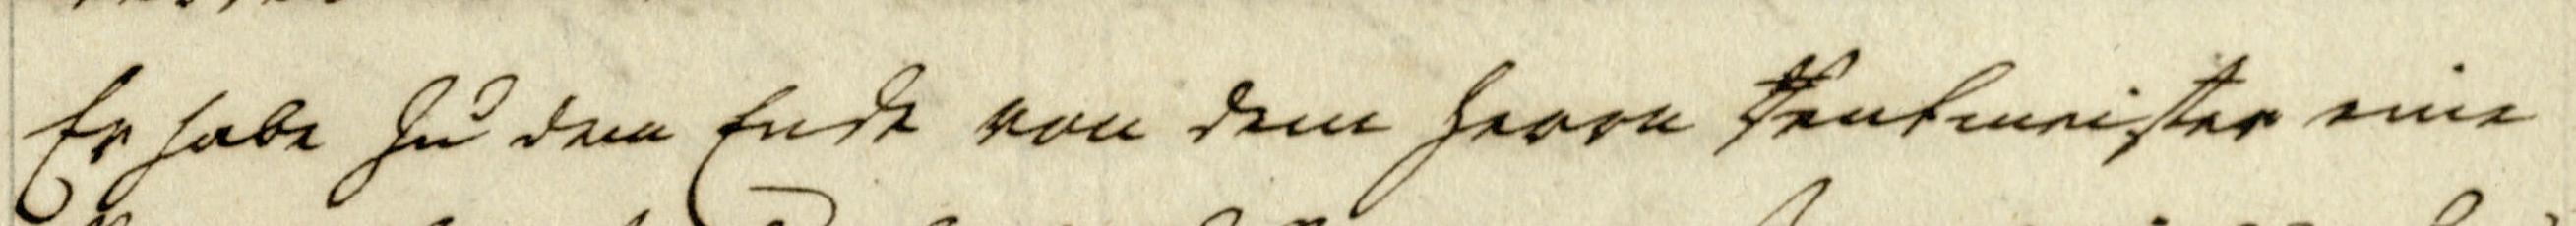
Er habe zu dem Ende von dem Herrn Rentmeister eine
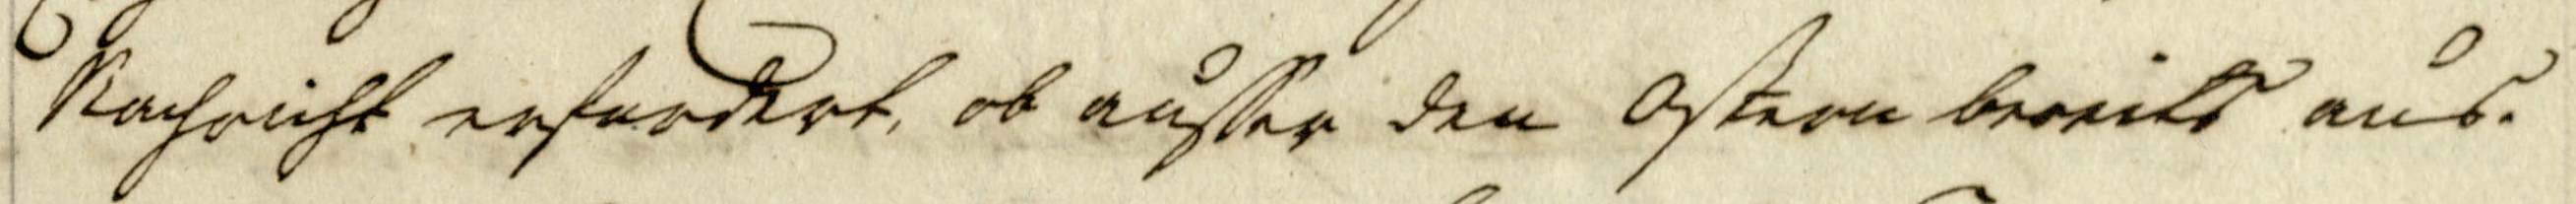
Nachricht erfordert, ob ausser den Ostern bereits aus¬
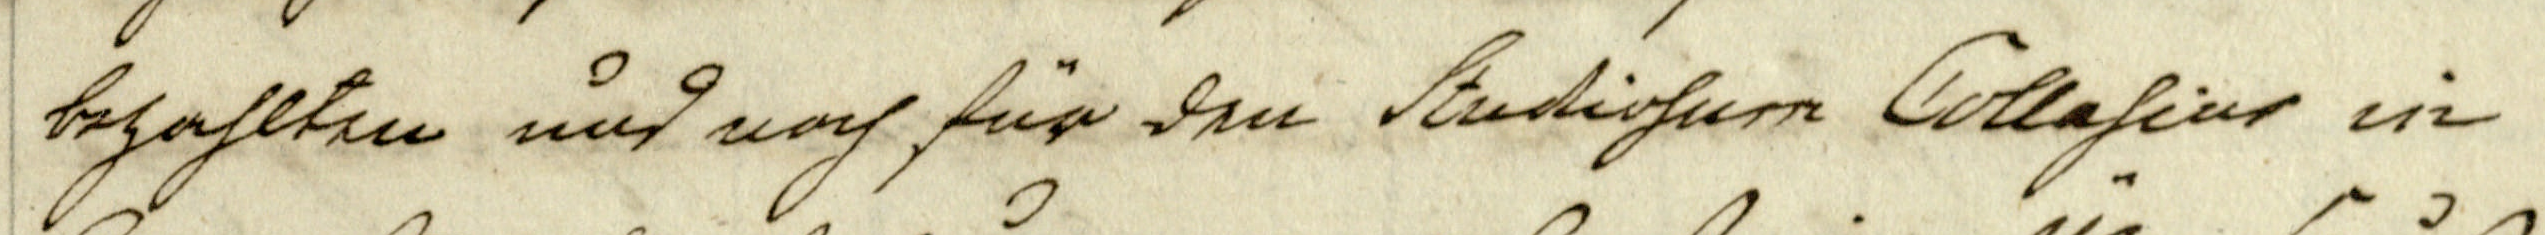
bezahlten und noch für den Studiosum Collasius in
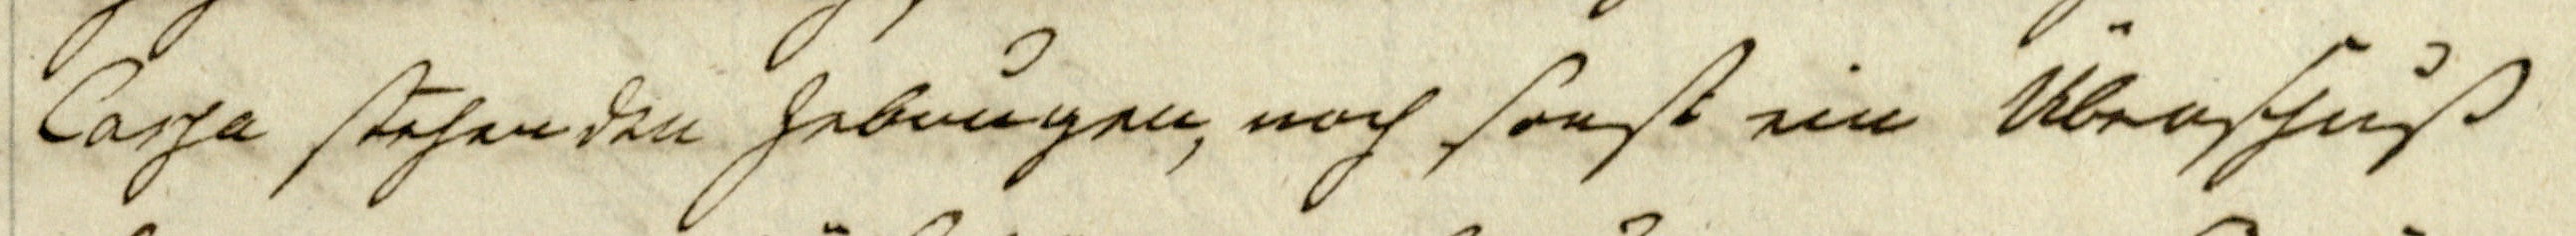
Cassa stehenden Hebungen, noch sonst ein Überschuß
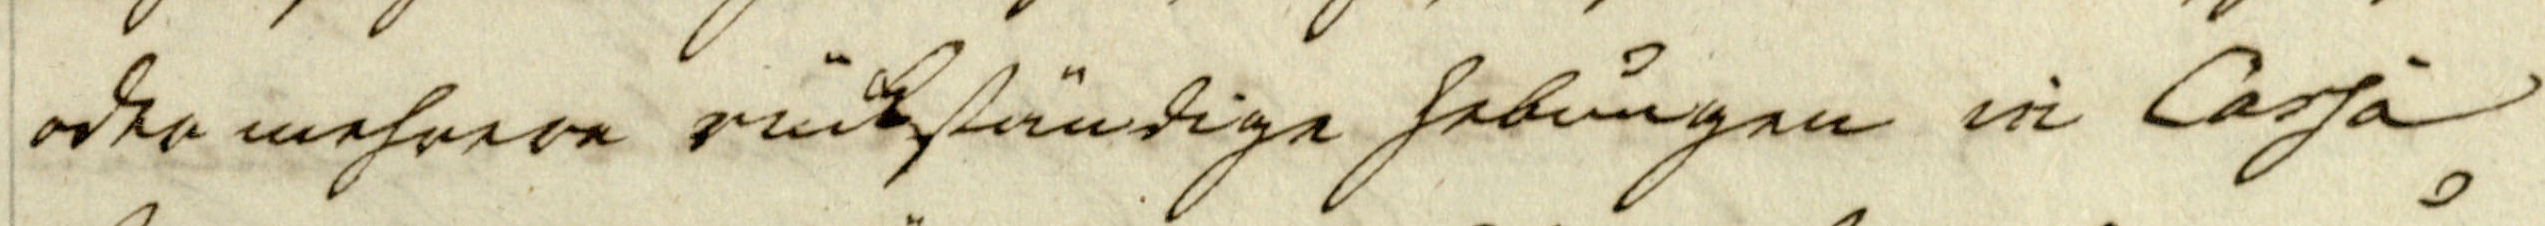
oder mehrere rückständige Hebungen in Cassa
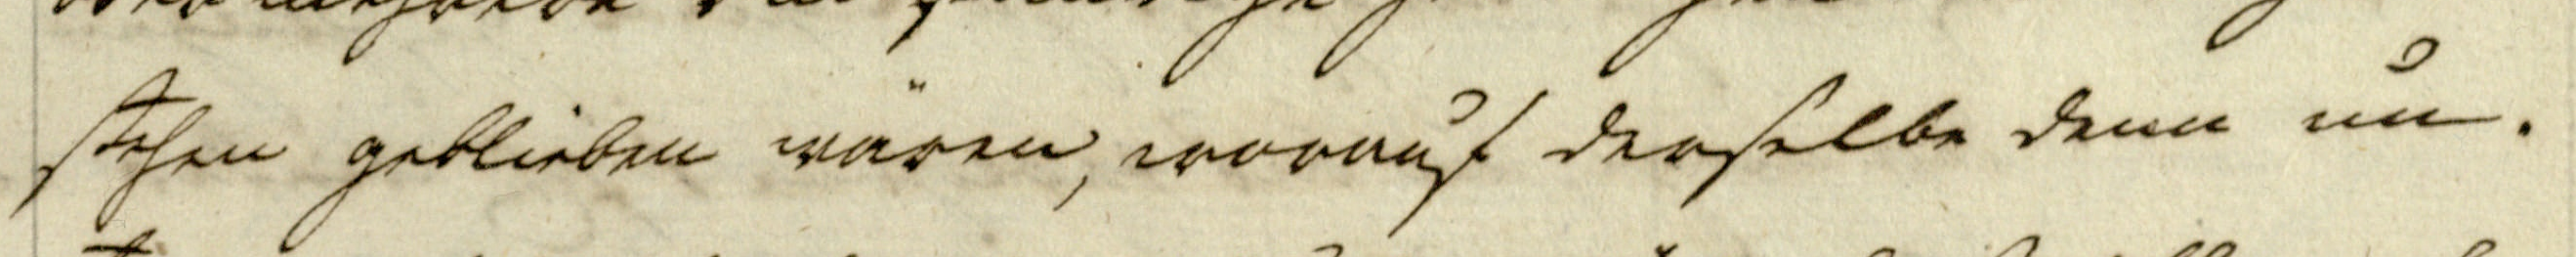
stehen geblieben wären, worauf derselbe denn un¬
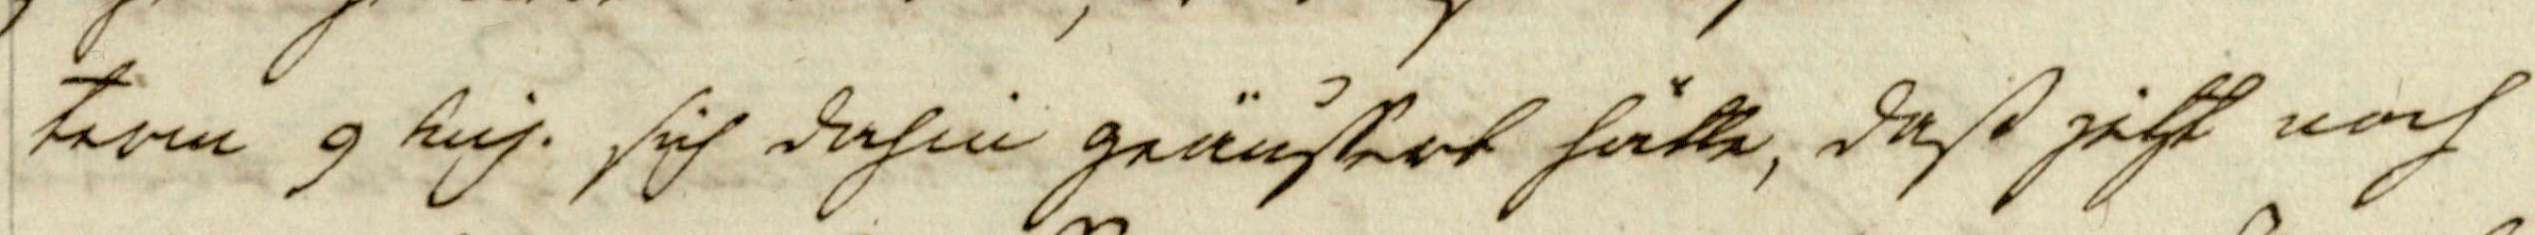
term 9. huj. sich dahin geäussert hätte, daß jetzt noch
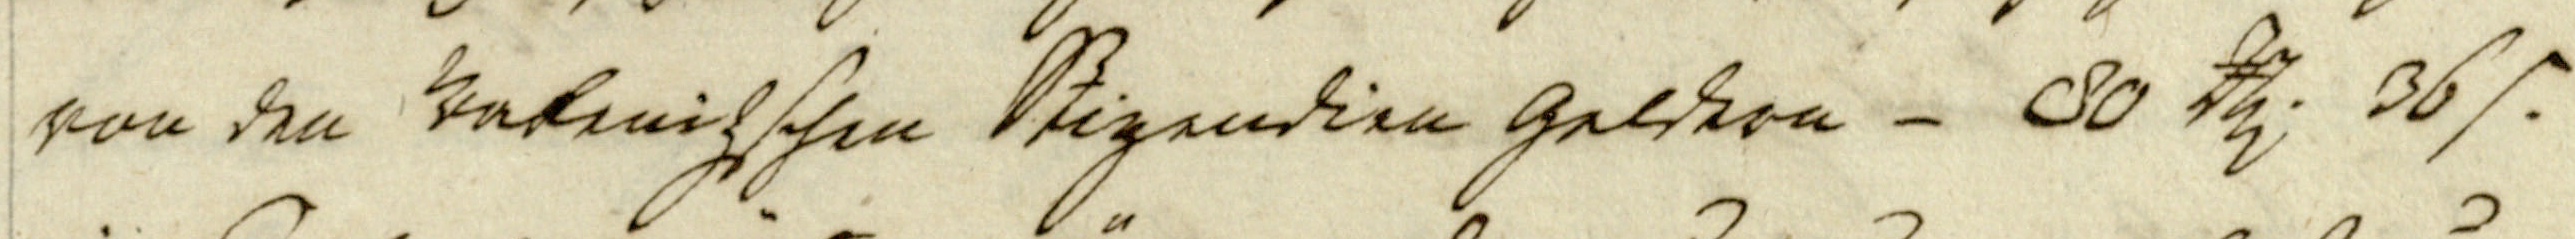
von den Wakenizschen Stipendien Geldern 80 Rt. 36 s.
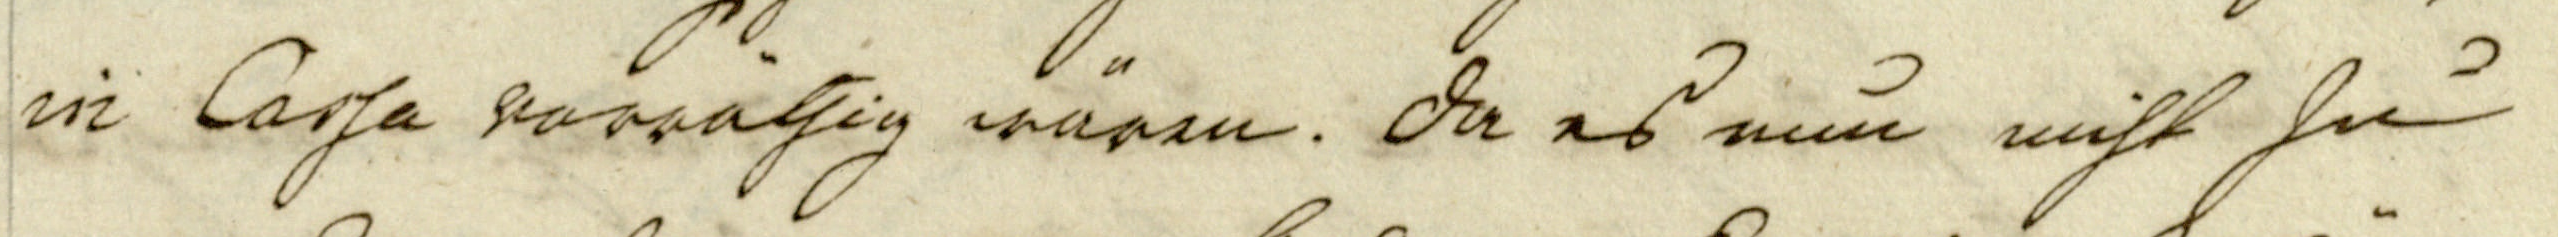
in Cassa vorräthig wären. Da es nun nicht zu
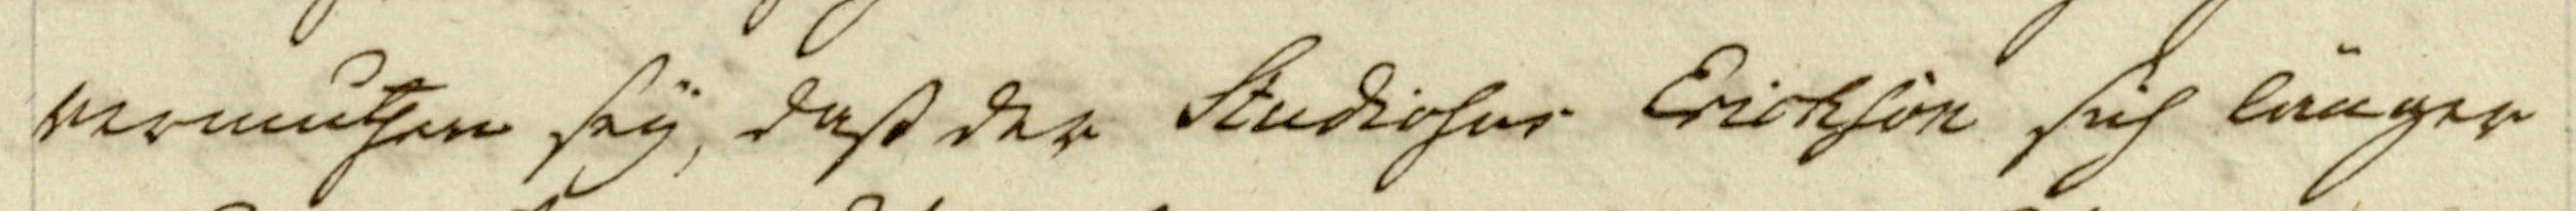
vermuthen seÿ, daß der Studiosus Erichson sich länger
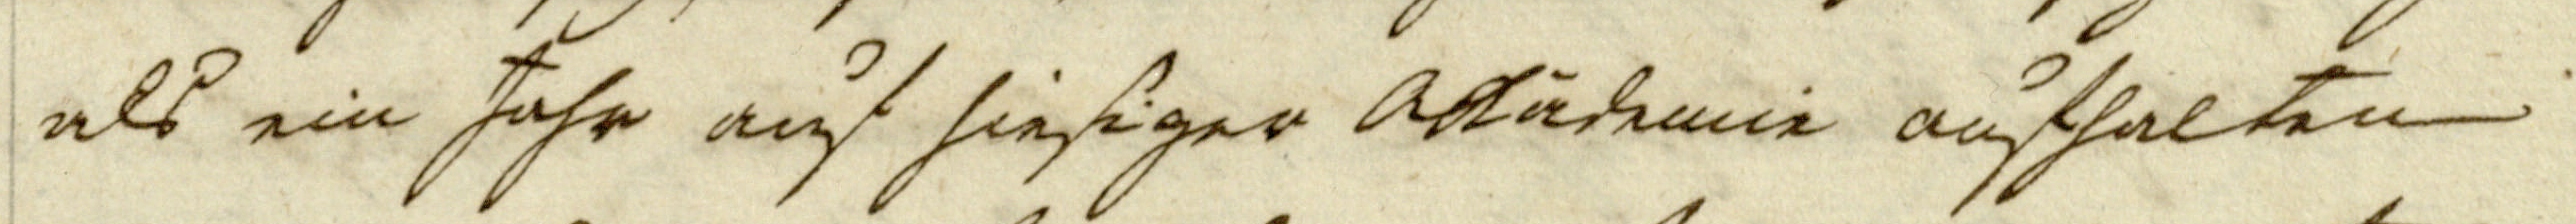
als ein Jahr auf hiesiger Akademie aufhalten
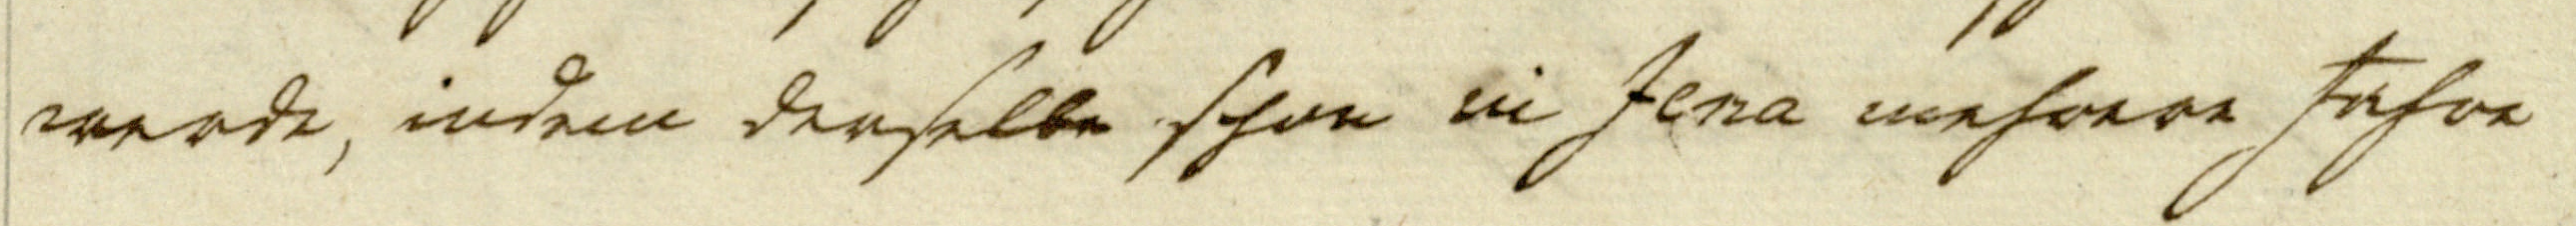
werde, indem derselbe schon in Jena mehrere Jahre
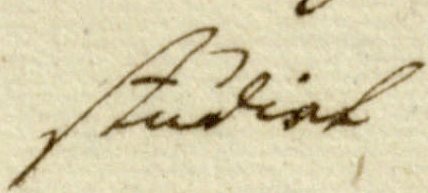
studirt
